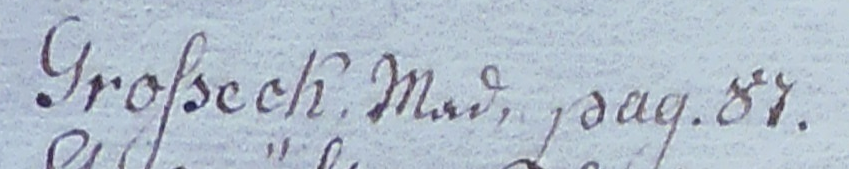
Grosseck, Mad, pag. 87.
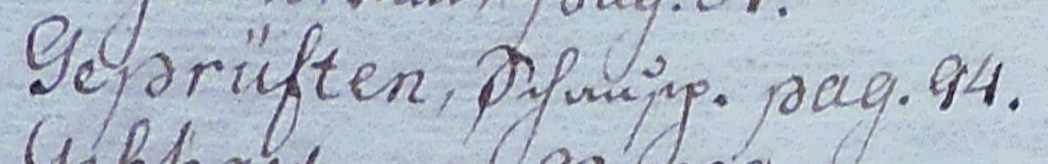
Geprüften, Schausp. pag. 94.
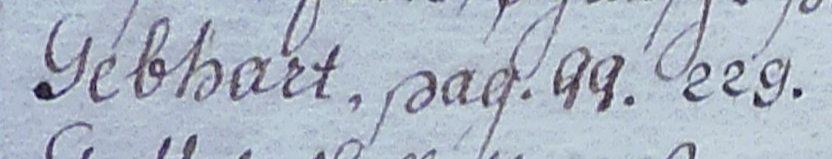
Gebhart, pag. 99. 229.
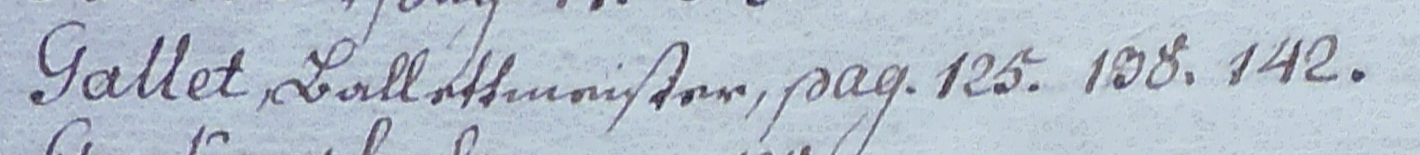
Gallet, Ballettmeister, pag. 125. 138. 142.
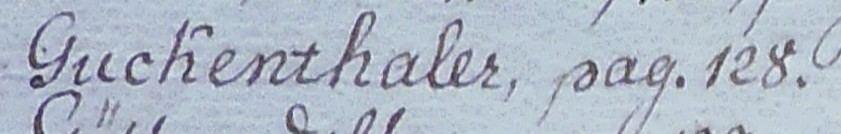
Guckenthaler, pag. 128.
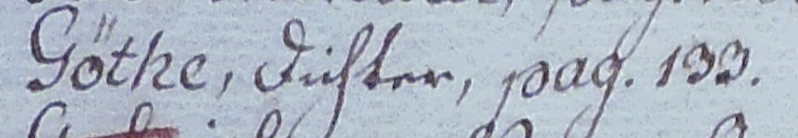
Göthe, Dichter, pag. 133.
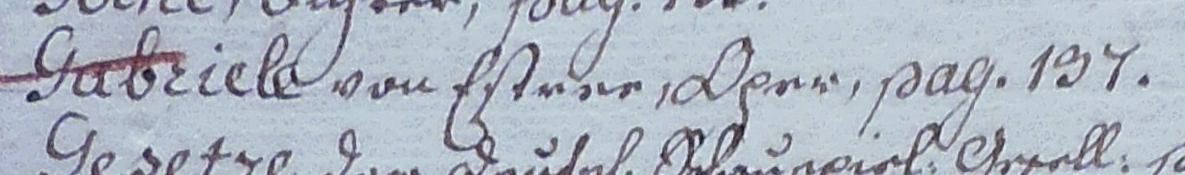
Gabriele von Estree, Oper, pag. 137.
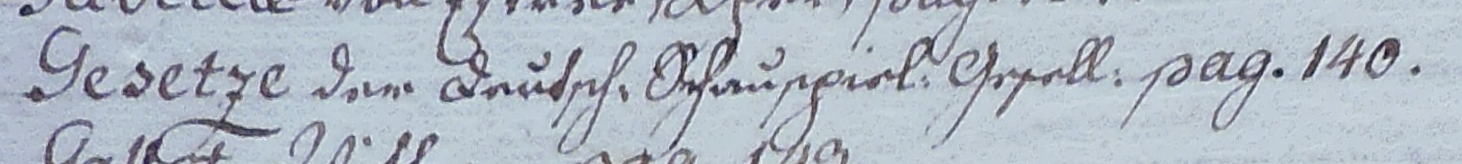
Gesetze der Deutsch: Schauspiel: Gesell: pag. 140.
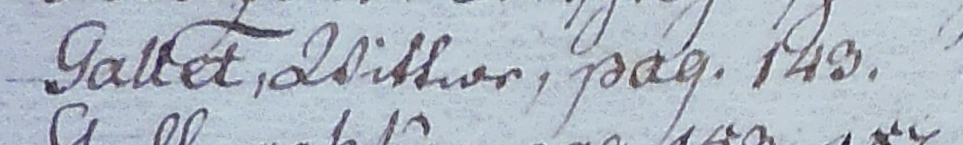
Gallet, Wittwe, pag. 143.
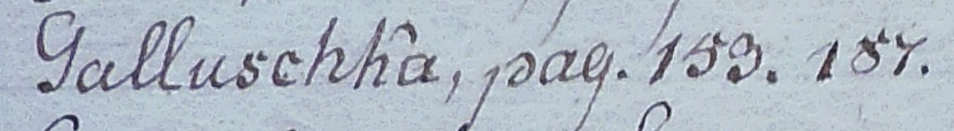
Galluschka, pag. 153. 187.
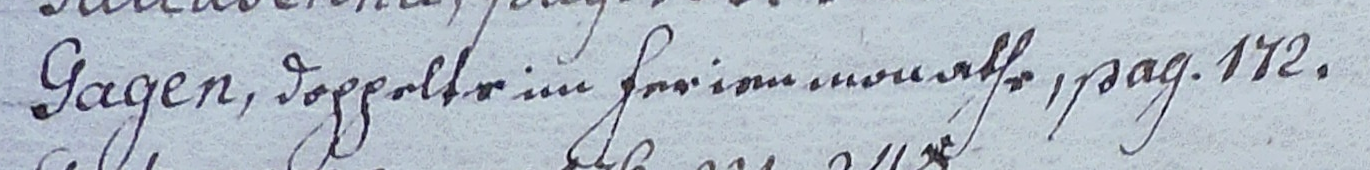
Gagen, doppelte im Ferienmonathe, pag. 172.
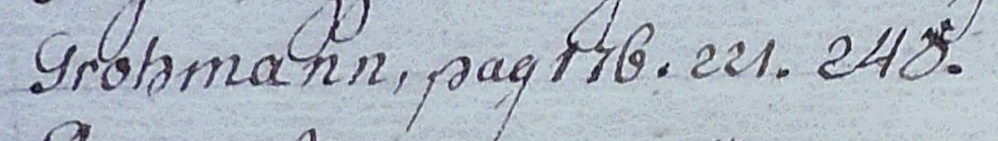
Grohmann, pag. 176. 221. 248.
